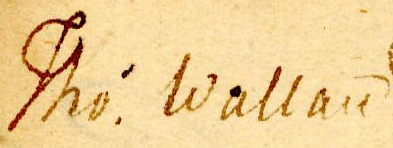Tho: Wallace
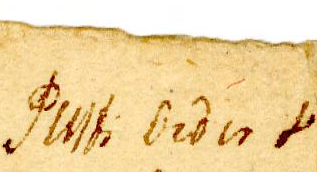Plll Order &
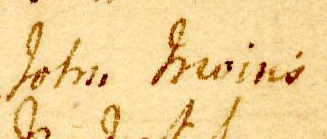John Irwin's
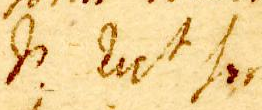J. Rec^t for
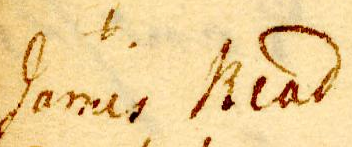James Read
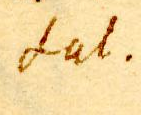Sal.
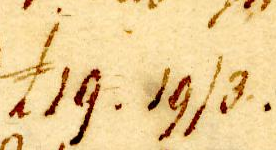£19. 19s3.
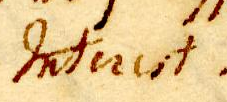Interest.
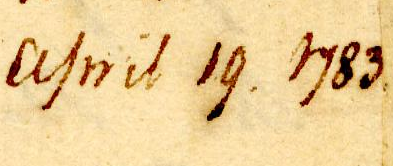April 19. 1783.
